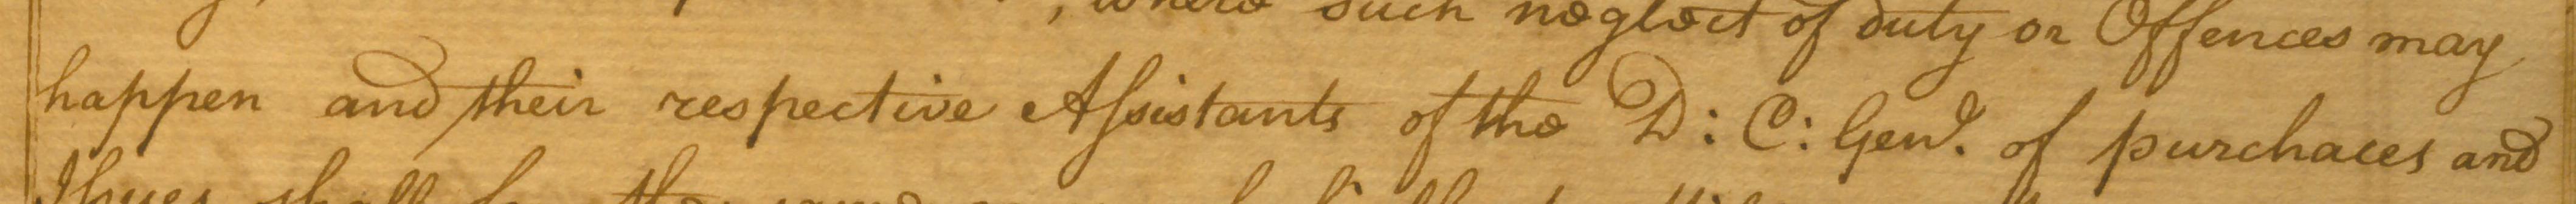happen and their respective Assistants to the D: C: Gen^l. of purchaces and
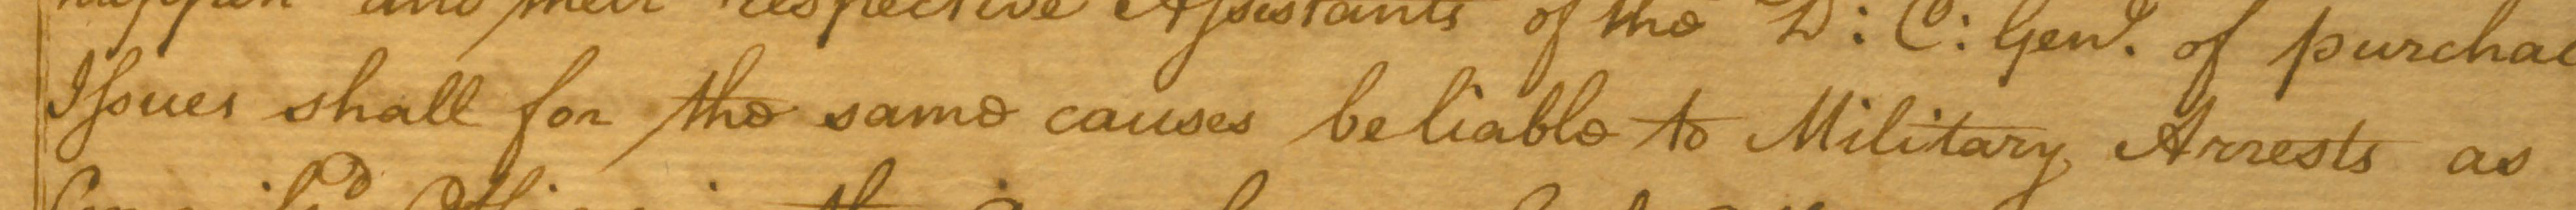Issues shall for the same causes be liable to Military Arrests as
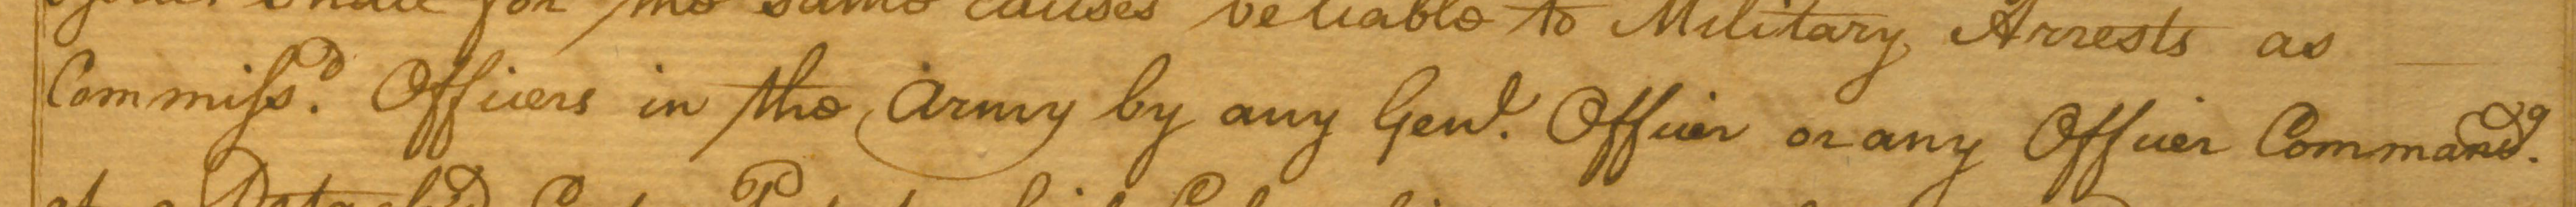Commiss^d. Officers in the army by any Gen^l. Officer or any Officer Command^g.
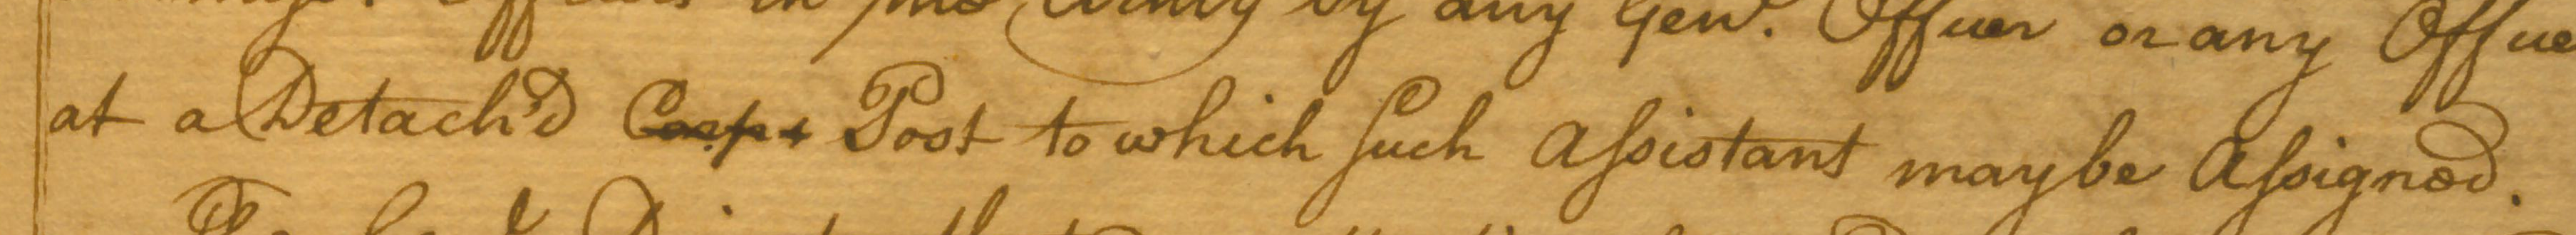at a Detach'd [Corps] Post to which such Assistant maybe Assigned.
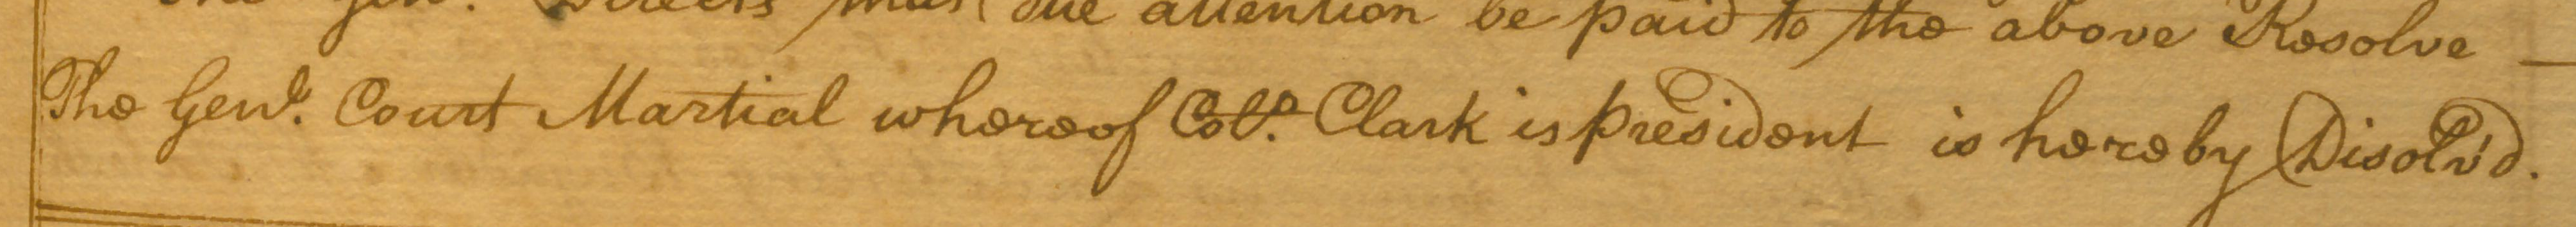The Gen^l. Court Martial whereof Col^o. Clark is president is hereby Dissolv'd/
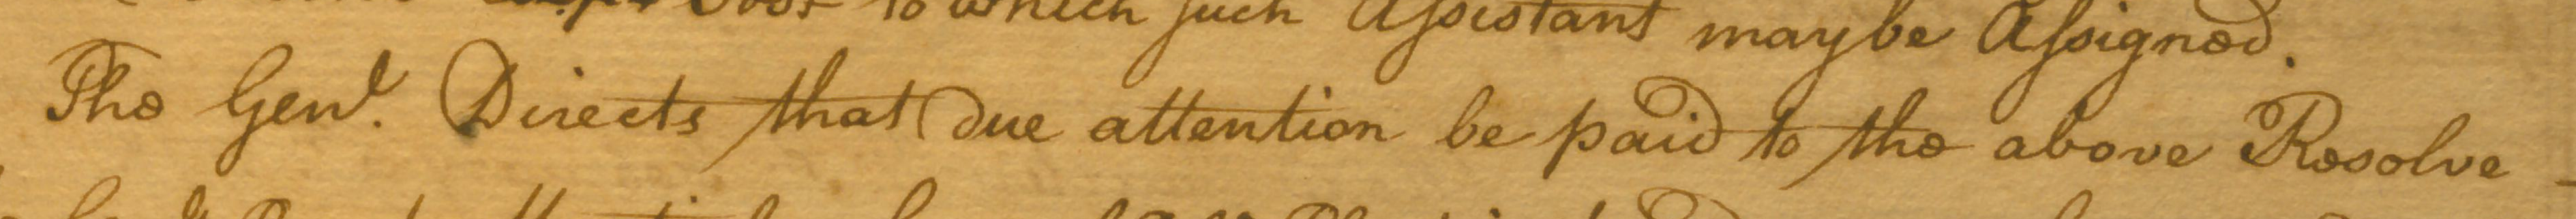The Gen^l. Directs that due attention be paid to the above Resolve
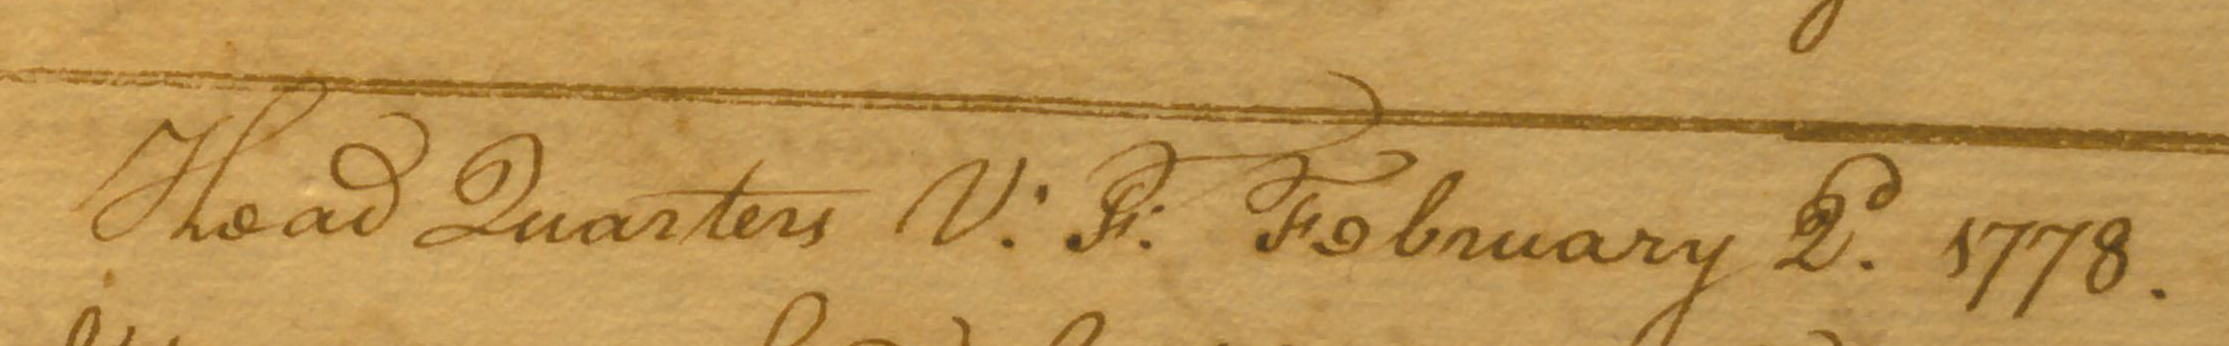Head Quarters V: F: February 2^d. 1778.
